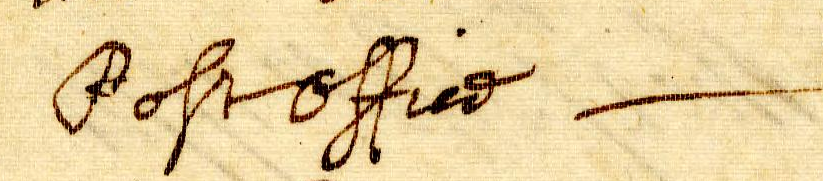Post office
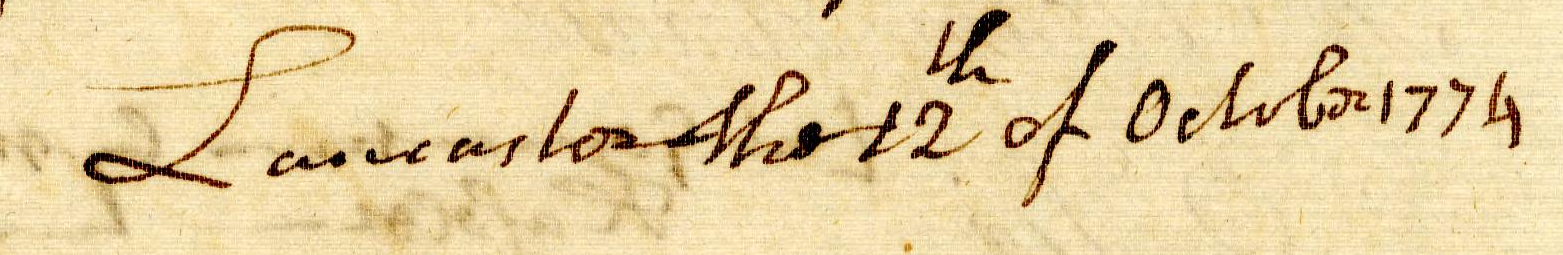Lancaster the 12^th of October 1774
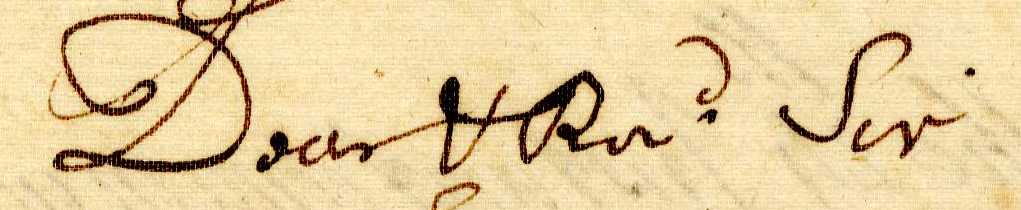Dear & Rev^d. Sir
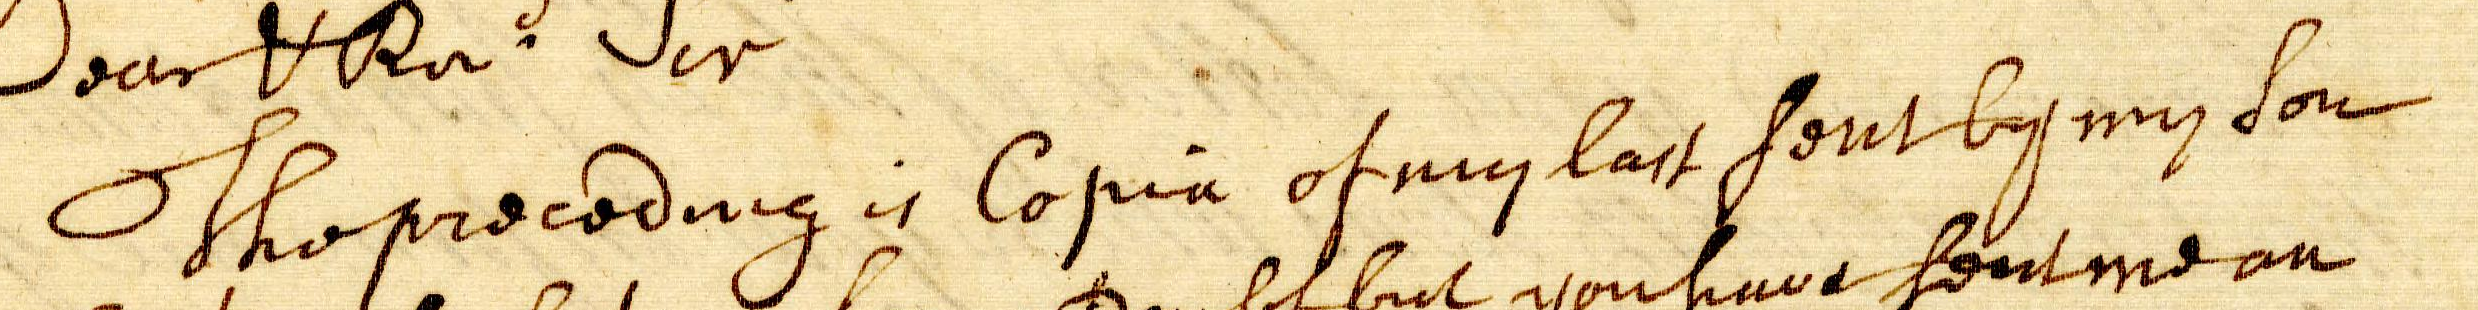The preceding is Copia of my last sent by my son
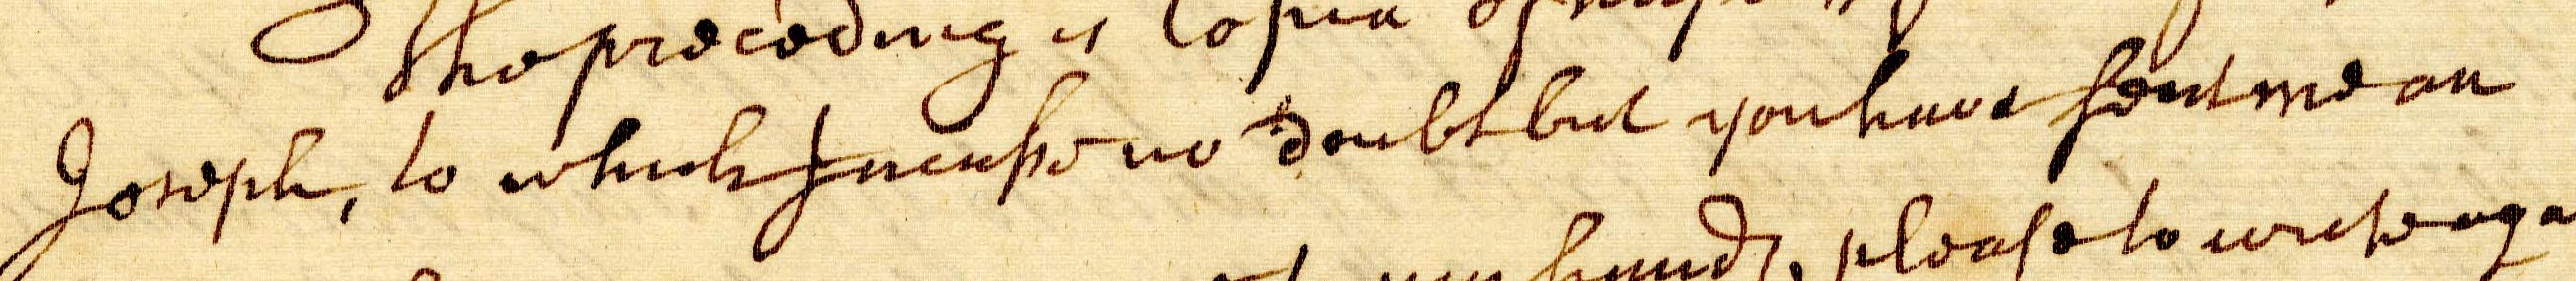Joseph, to which Inclose no doubt but you have sent me an
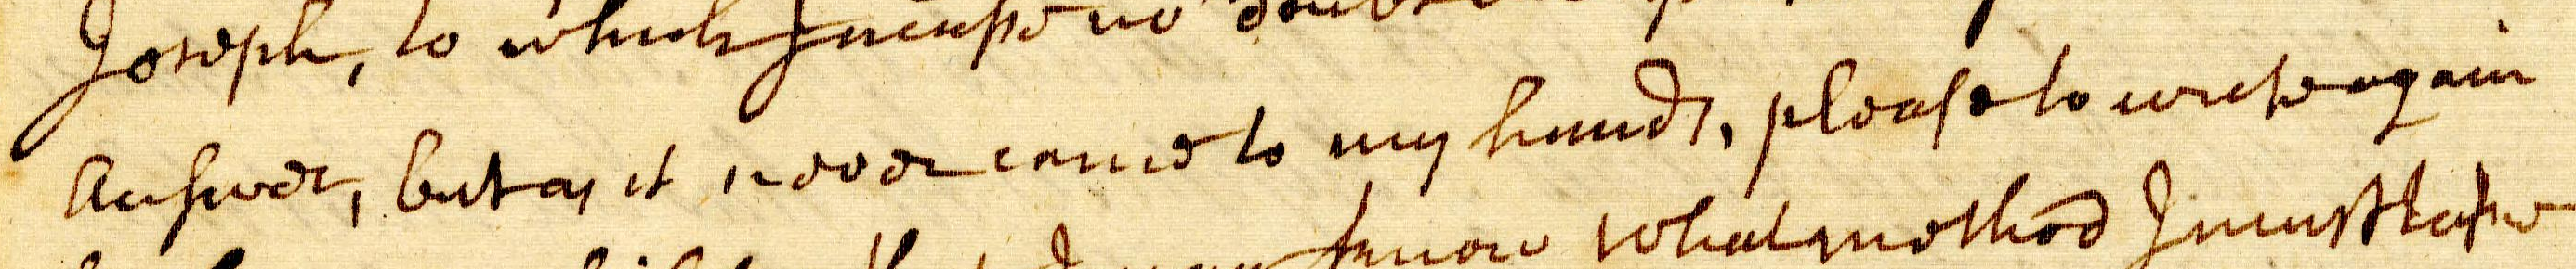Answer, but as it never came to my hands, please to write again
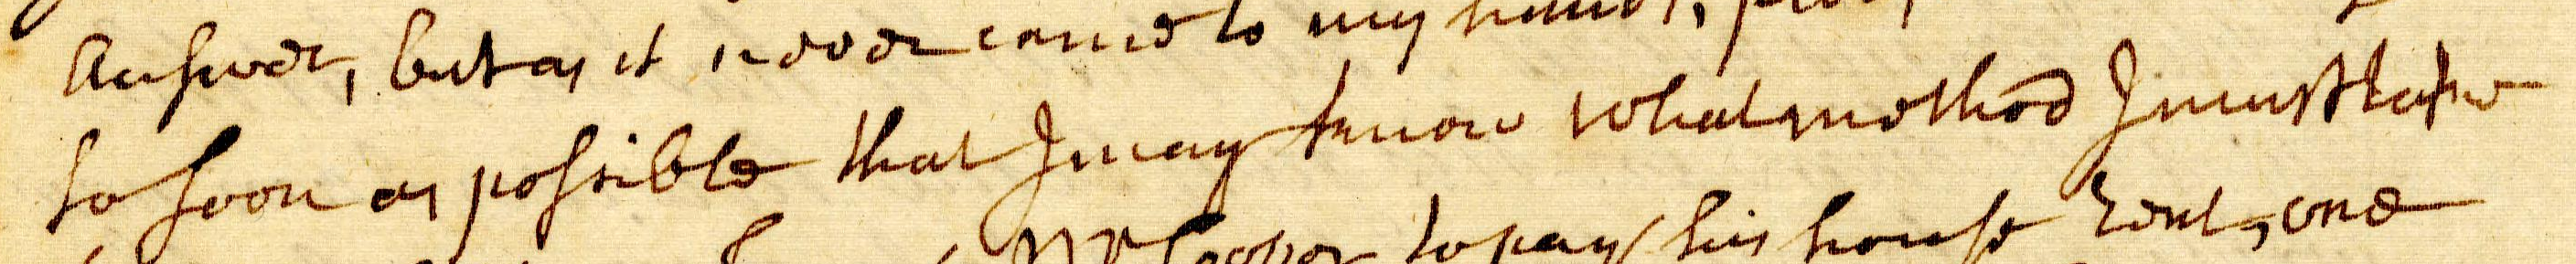so soon as possible that I may know what method I must take
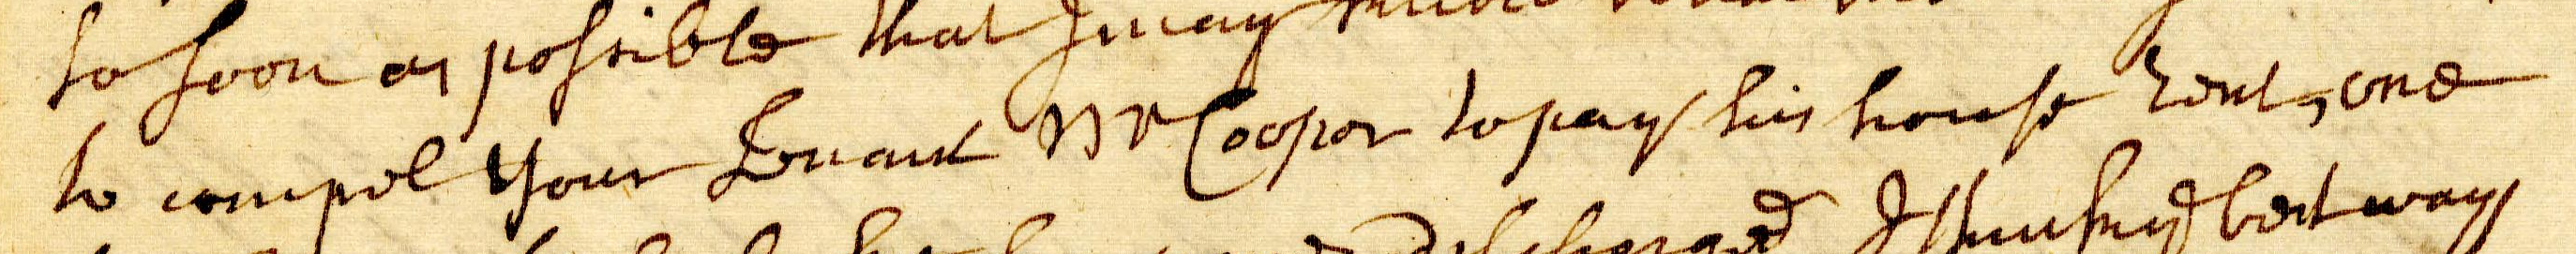to compel Your Servant M^r Cooper to pay his house rent, and
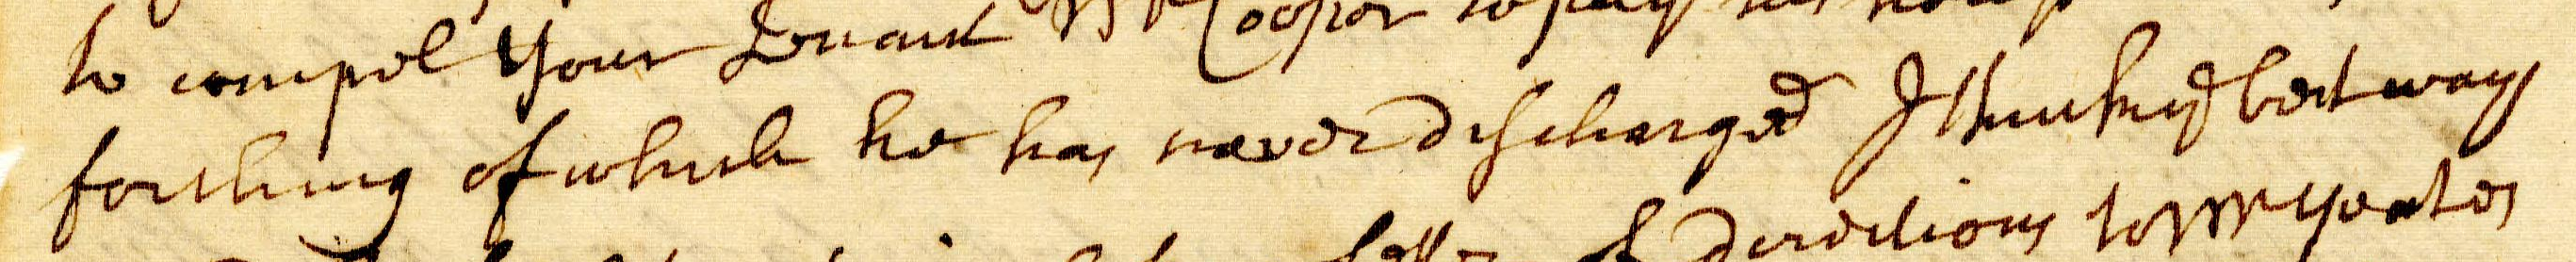farthing of which he has never discharged I think y^e best way
